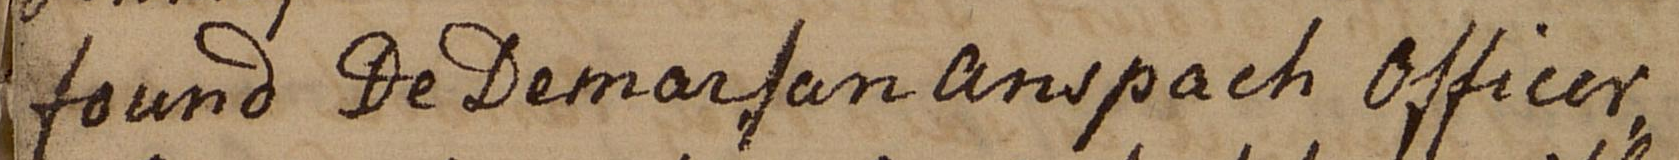found De Demarsan Anspach Officer
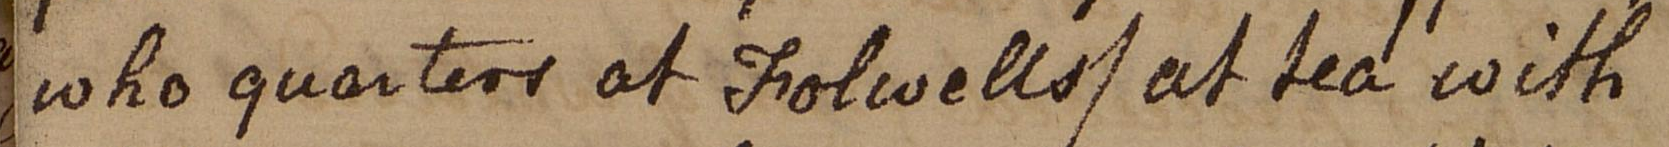who quarters at Folwells at tea with
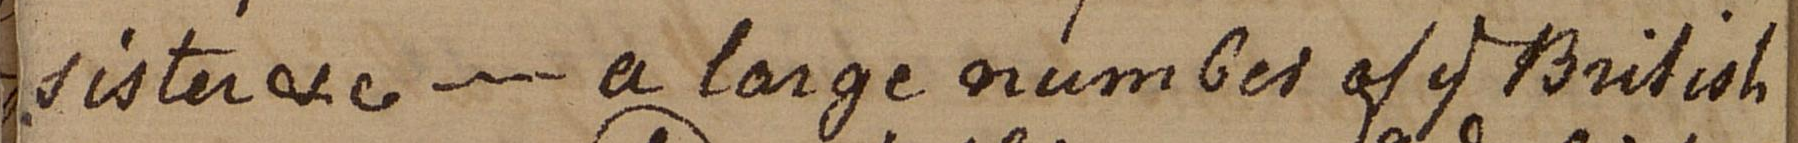sister &c- a large number of y^e British
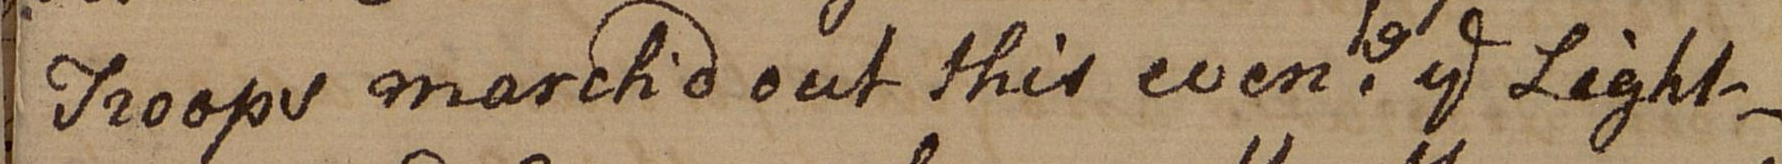Troops march'd out this even^g. y^e Light
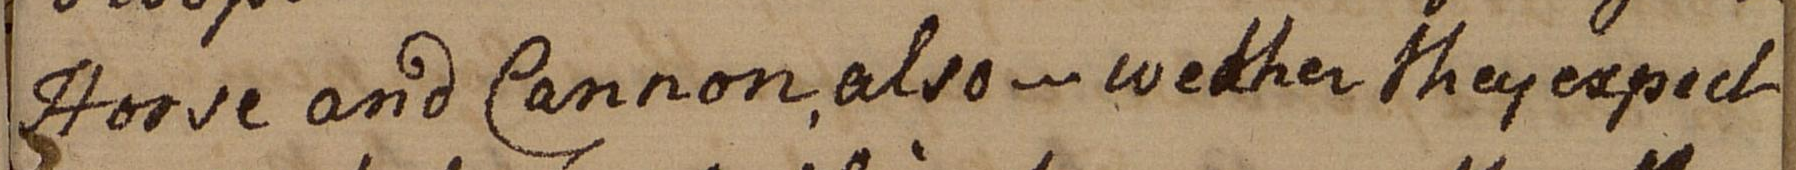Horse and Cannon, also- wether they expect
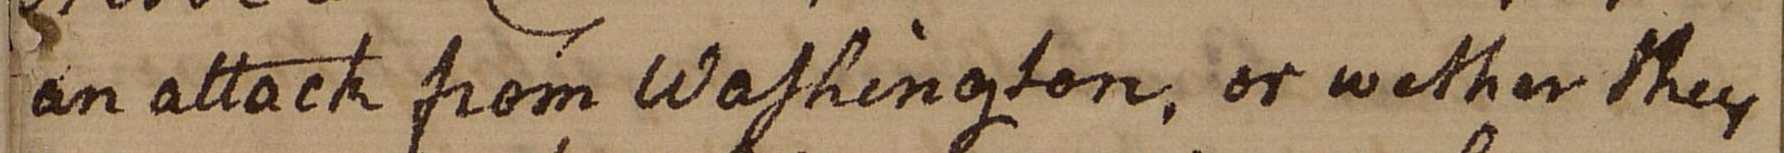an attack from Washington, or wether they
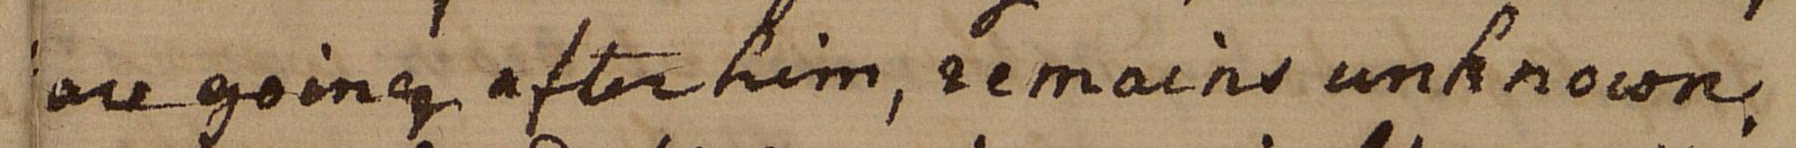are going after him, remains unknown.
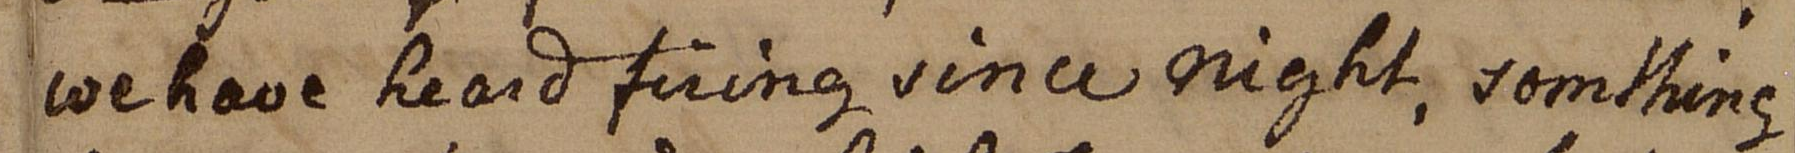we have heard firing since night, somthing
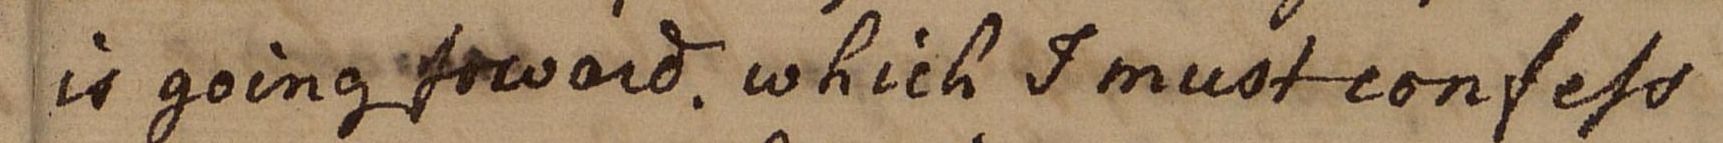is going foward, which I must confess
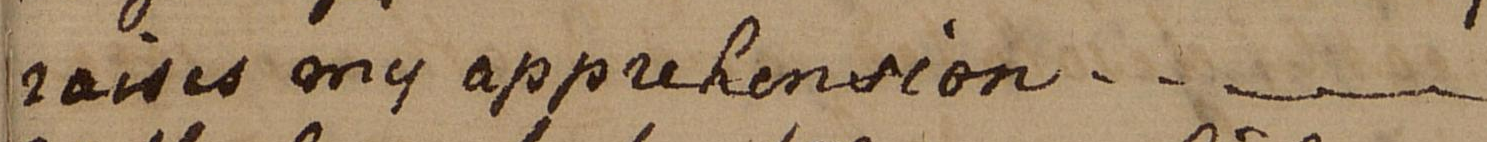raises my apprehension--
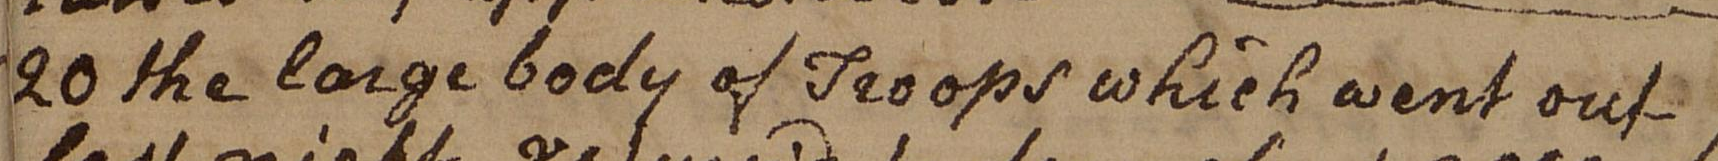20 the large body of Troops which went out
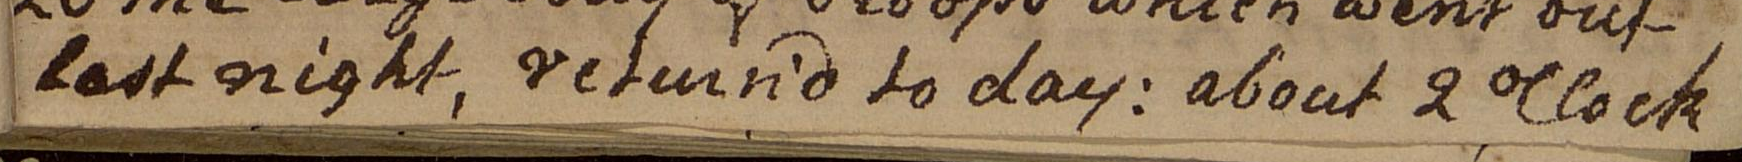last night, return'd to day: about 2 ^o Clock
